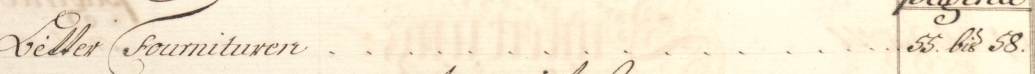Better Fournituren. 55. bis 58.
